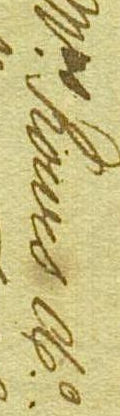M^rs Rowes d^o
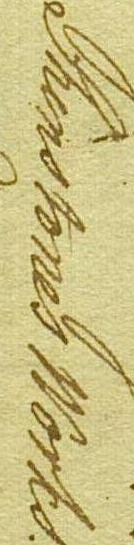Shenstones Works.
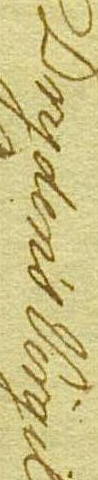Dryden's Virgil
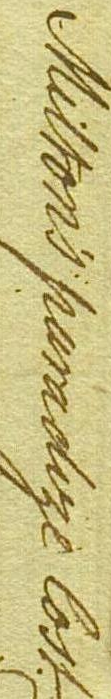Milton's paradize lost.
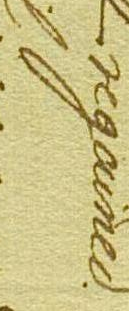regained.
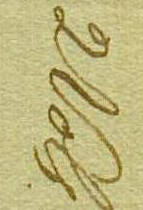2 Vols.
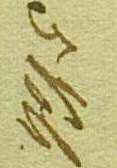5 Vols.
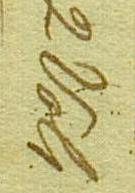2 Vols.
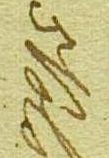5 Vols.
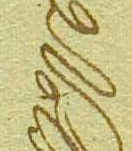2 Vols
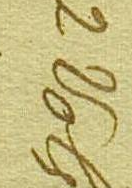2 Vols
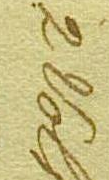2 Vols
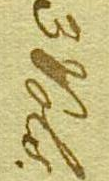3 Vols.
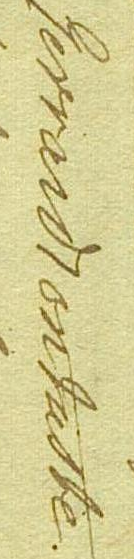Gerrard on Taste.
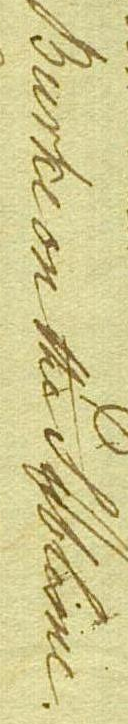Burke on the Sublime.
